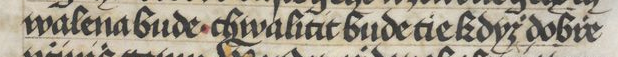walena bude.chwalitit bude tie když dobṙe
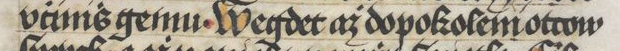vċíníṡ gemu.Wegdet aż dopokolení otcow
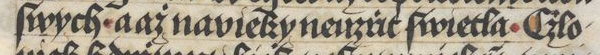ſwych.a aż navieky neuzṙit ſwietla.Cṙlo¬
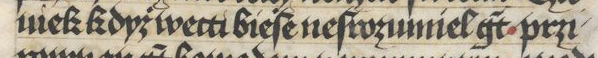uiek když wecti bíeẛe neſrozumiel ḡt.przi¬
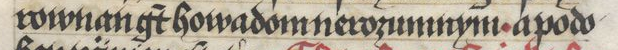rownan ḡt howadom nerozumnym.a podo¬
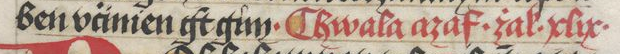ben vċínien ḡt gim.Chwala azaf.žal.xlix.
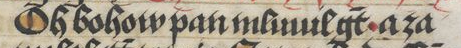Oh bohow pan mluuil ḡt.a za¬
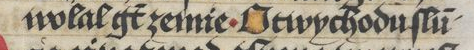wolal ḡt zemie.Otwychodu ſlū¬
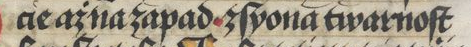cie aż na zapad.zſyona twarnoſt
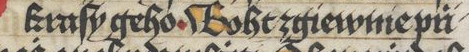kraſy geho.Boht zgiewnie pří¬
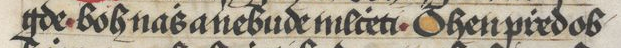gde.boh naṡ a nebude mlċeti.Ohen pṙed ob¬
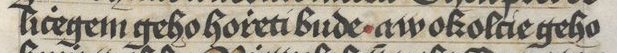liċegem geho hoṙeti bude.a w okolcie geho
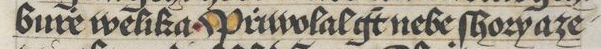buṙe welika.Pṙiwolal ḡt nebe ſhory a ze¬
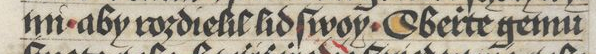mi.aby rozdielil lid ſwoy.Sbeṙte gemu
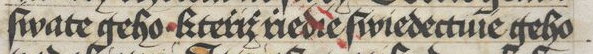ſwate geho.kteṙíż ṙiedíe ſwiedectuíe geho
